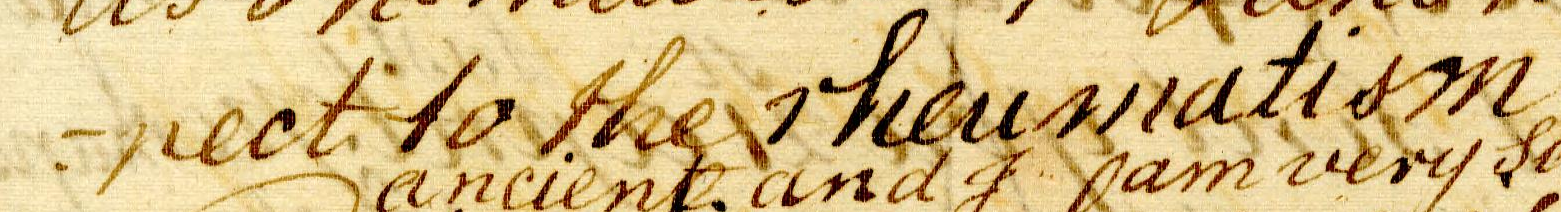-pect to the rheumatism
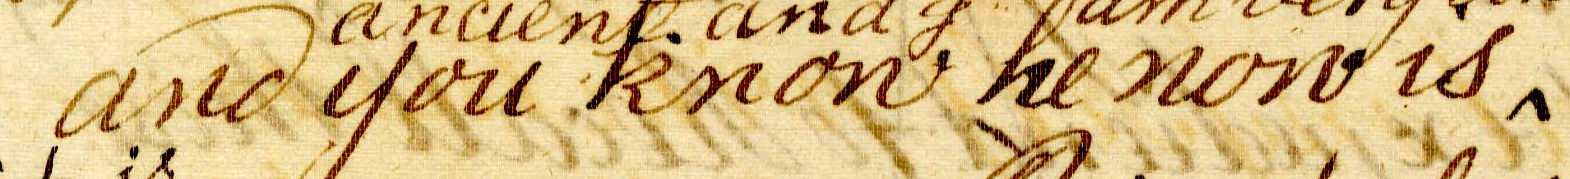And you know he now is
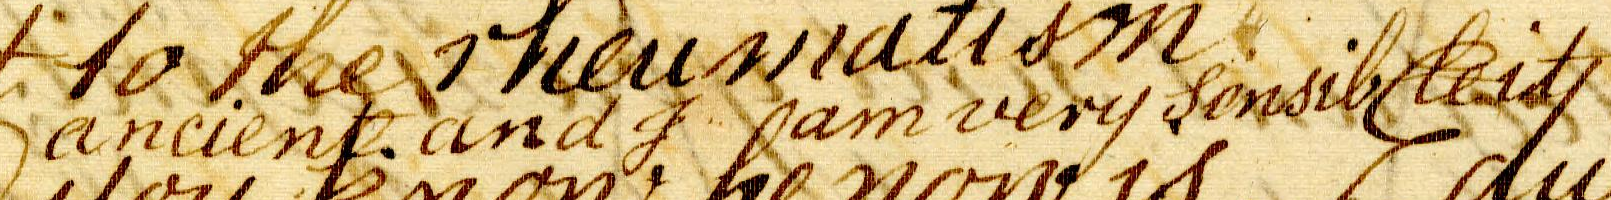ancient and I am very sensible it
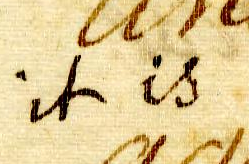it is
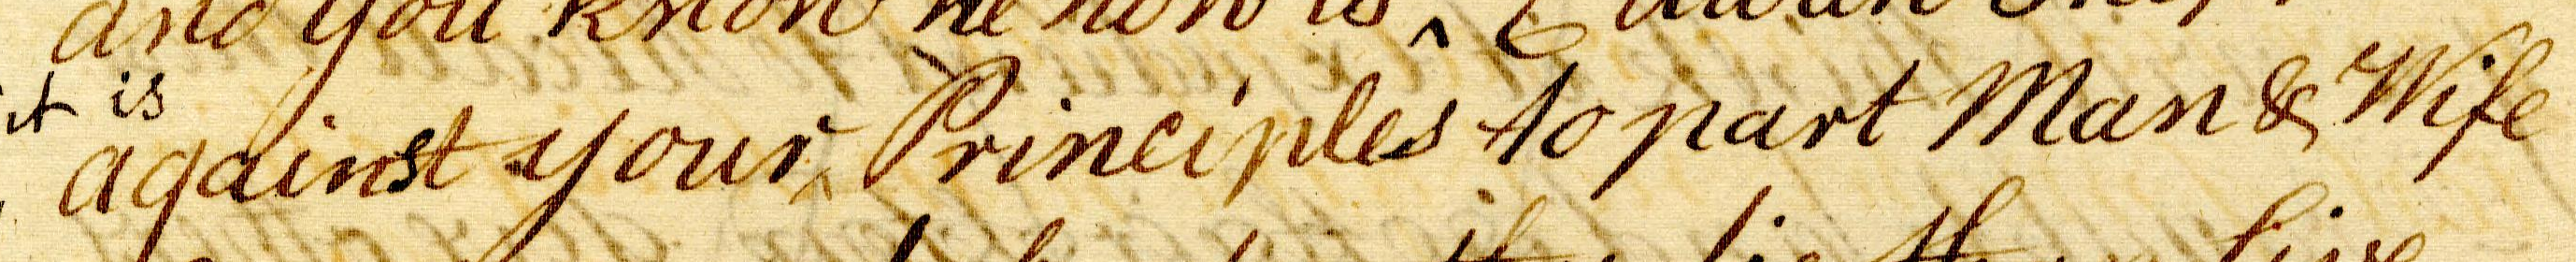against Your Principles to part Man & Wife
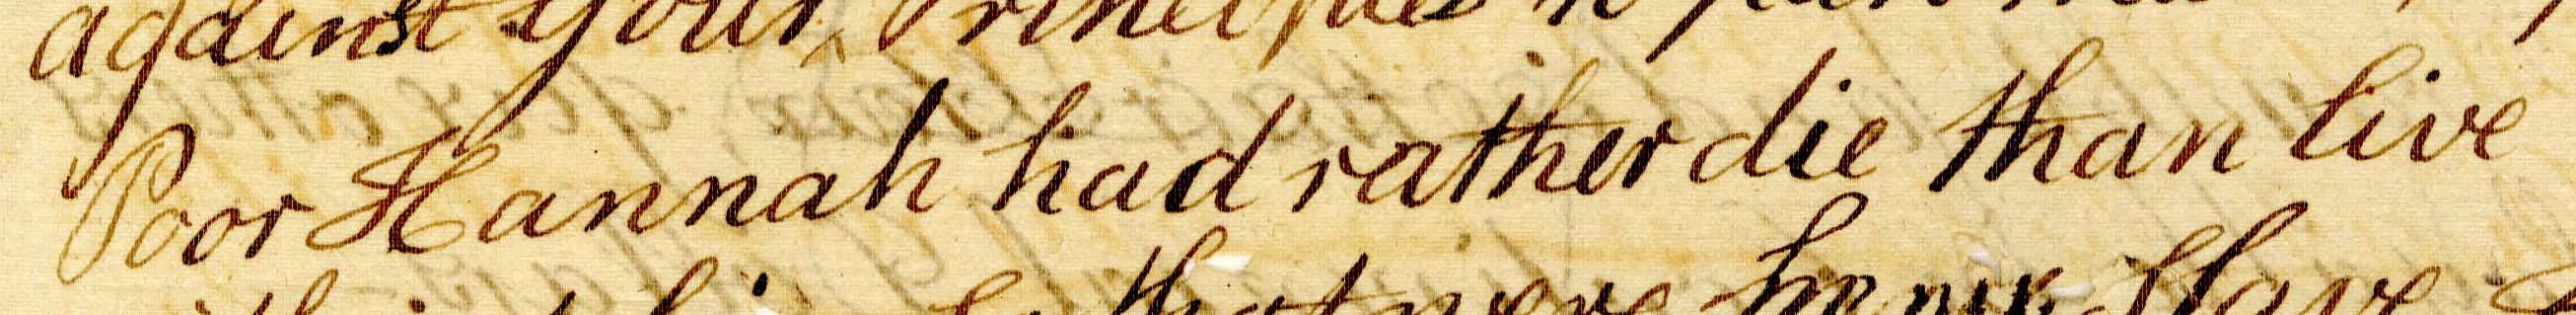Poor Hannah had rather die than live
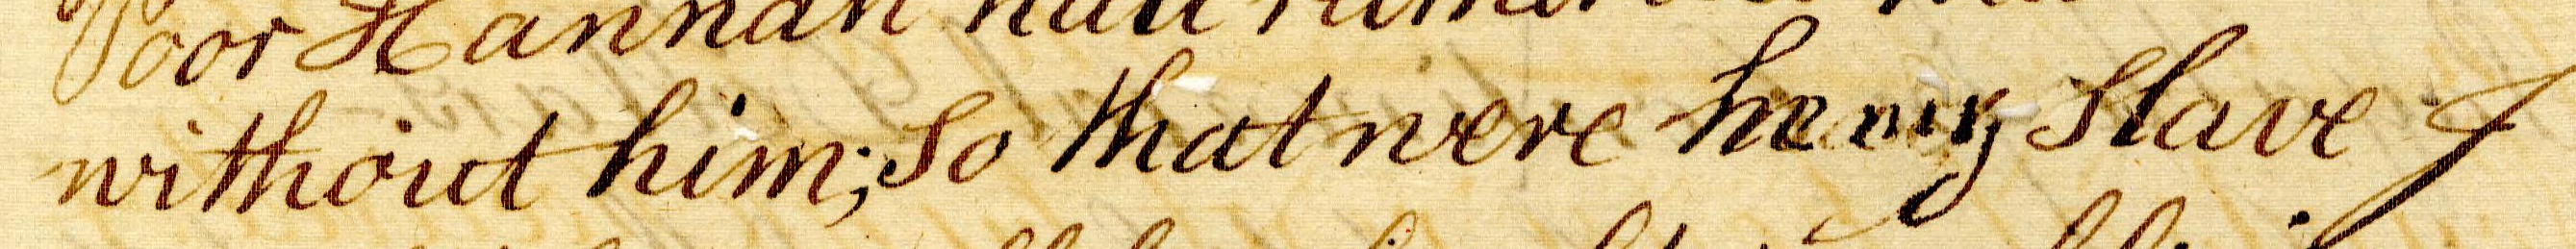without him; so that were he my Slave I
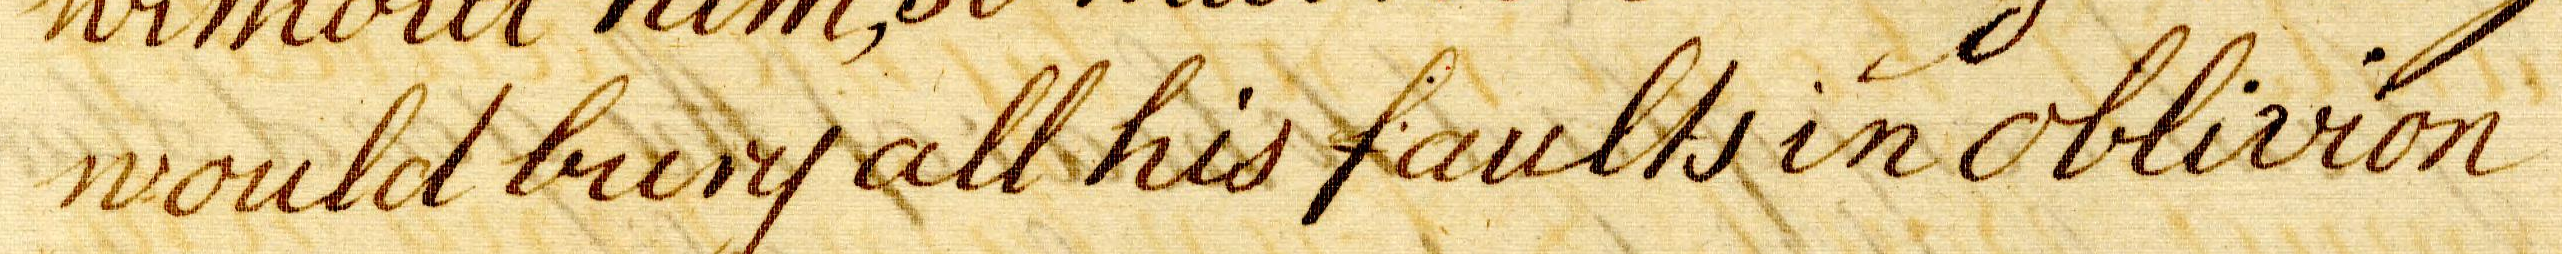would bury all his faults in oblivion
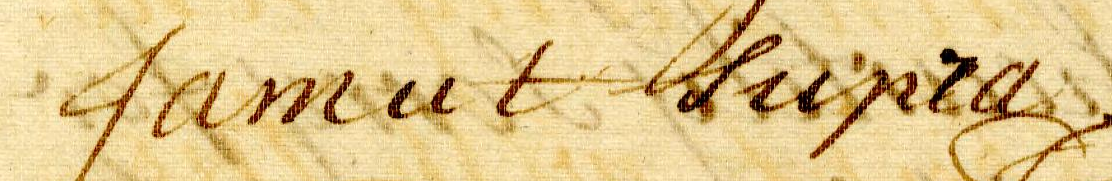I am ut Supra
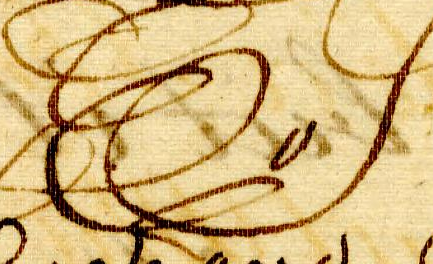E.S
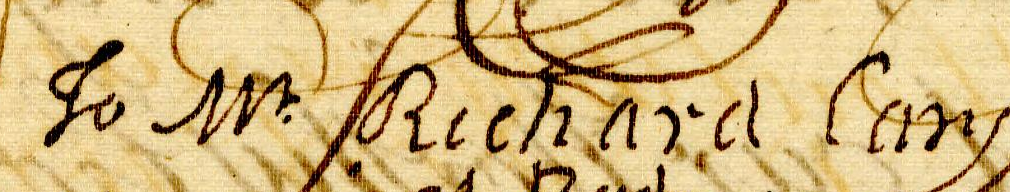to M^r. Richard Car
